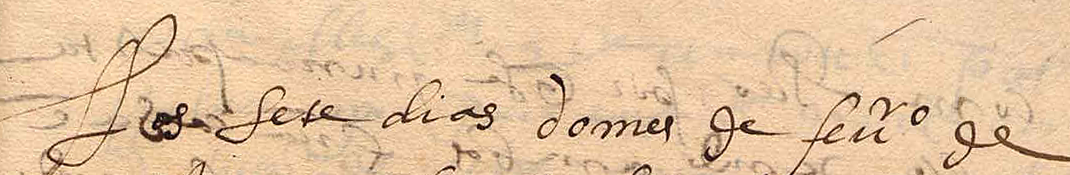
Aos sete dias do mes de feuro de
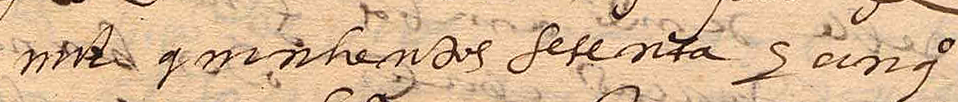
mil quinhentos setenta E cinqo
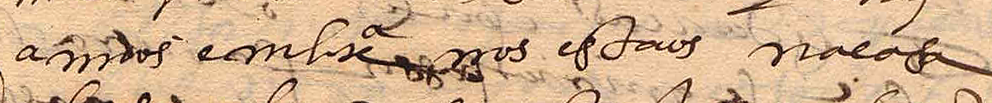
annos em lixa nos estaos na casa
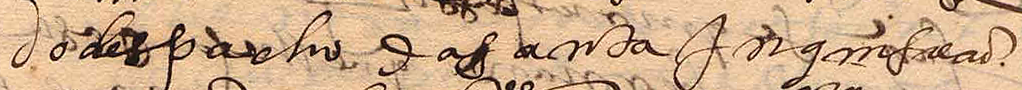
do despacho da santa Jnquisiçaõ
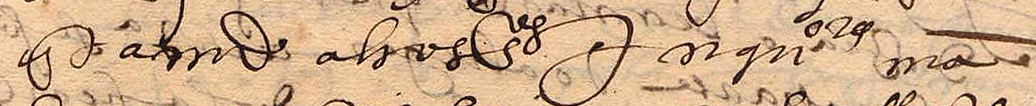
estamdo ali os sres Jnquores mā
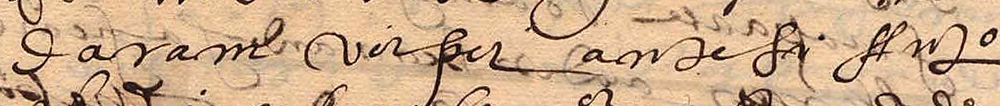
daram vir perante sy Anto
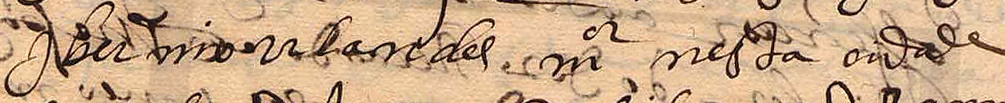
Jbernio irlandes mor nesta cidade
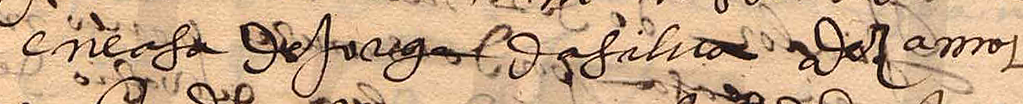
en casa de Jorge da silua a dez annos
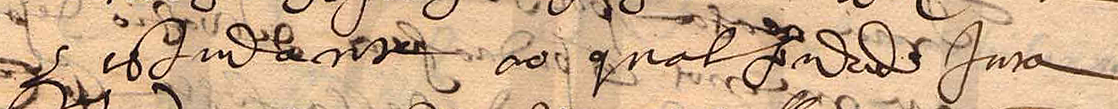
E estudante ao qual foi dado Jura
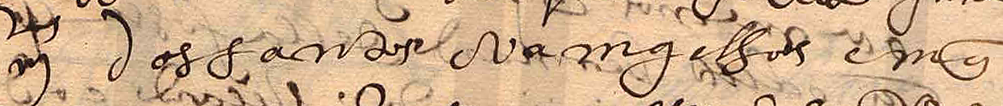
mto dos santos evamgelhos em q̄
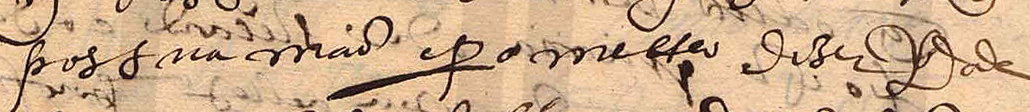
pos sua maõ e ꝓometteo dizer ꝟdade
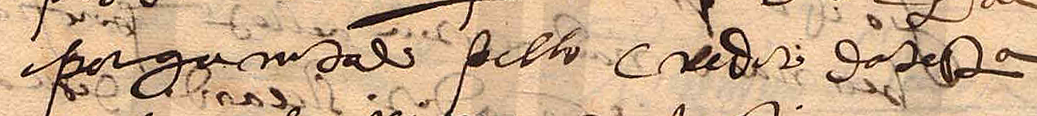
e pergumtado pello credito da testa
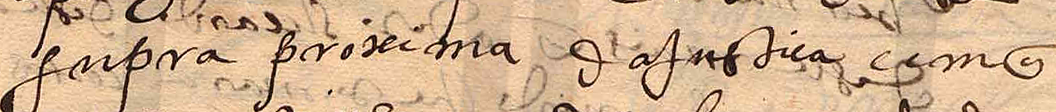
supra proxima da Justiça e em q̄
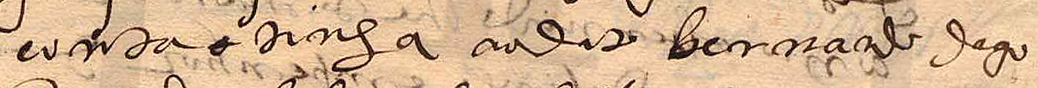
conta o tinha ao dito bernardo digo
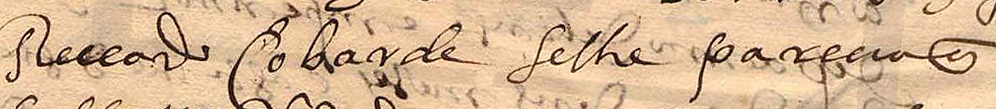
Reccardo Cobarde se lhe parecia q̄
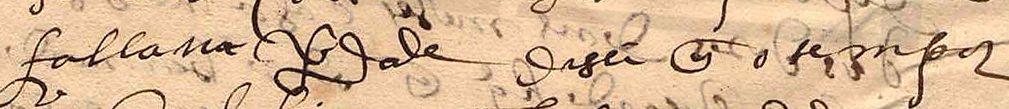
fallaua ꝟdade disse q̄ o tem por
